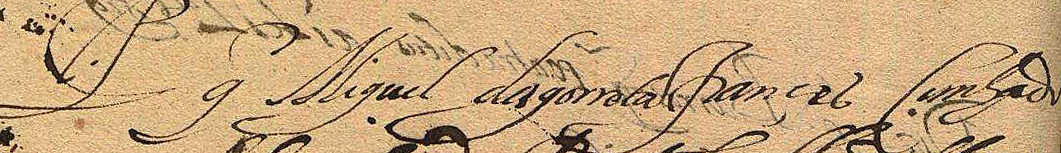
P q̄ Miguel da gorreta frances, Cunhado
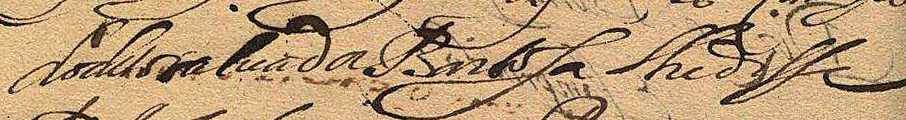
do dito saluador Barbosa lhe disse
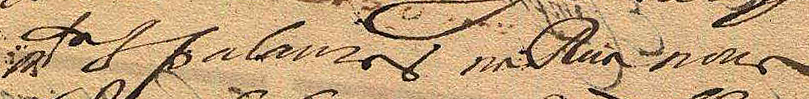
mtas palauras na Rua noua
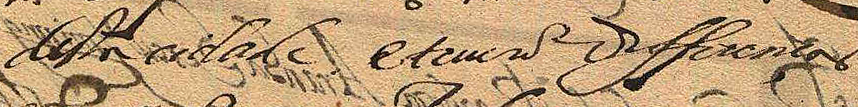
desta cidade e teuerō differenças
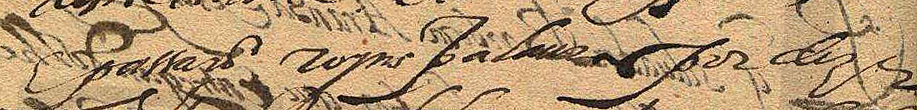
E passarō royns palauras por dizer
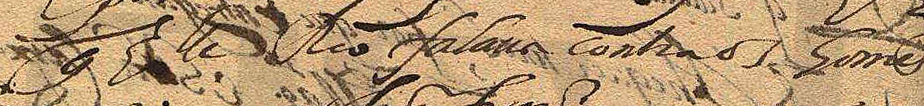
q̄ Elle Reo falaua contra os homēs
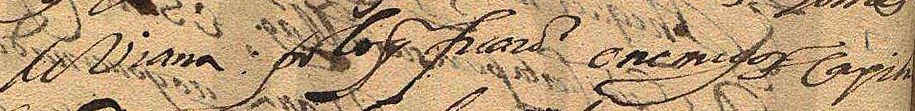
de Viana polo q̄ ficarō enemigos Capita
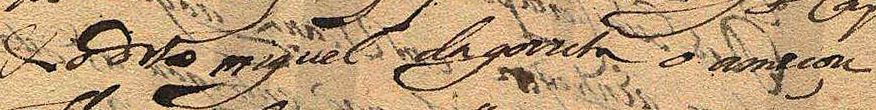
& o dito miguel da gorreta o ameçou
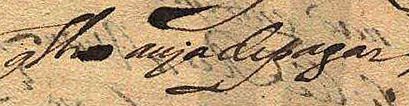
q̄ lho auja de pagar
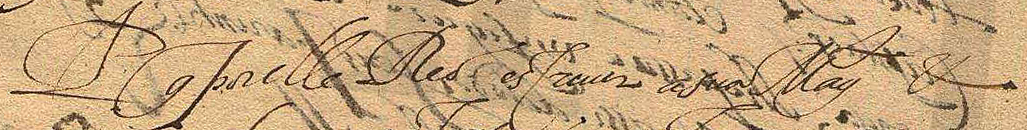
P q̄ por elle Reo esCreuer a sua Magte &
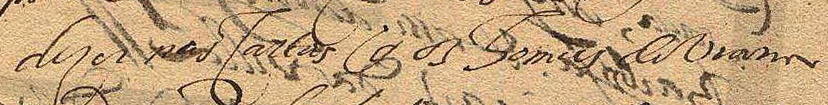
dizer nas Cartas q̄ os homeis de Viana
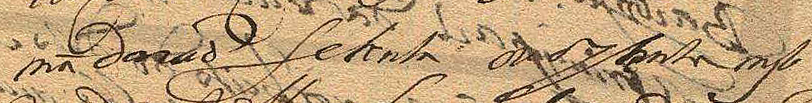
mādaraõ setenta ou oytenta mjl
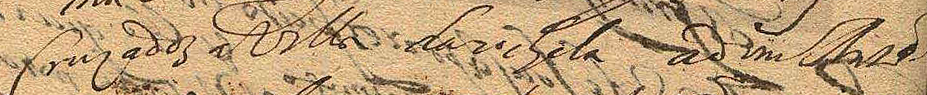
Cruzados a Villa da rochela a dom Anto
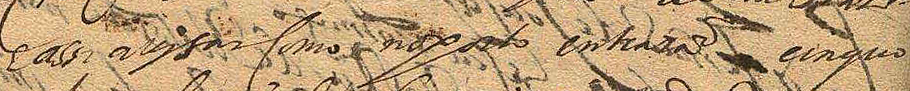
E assi auysar Como no porto entraraõ cinquo
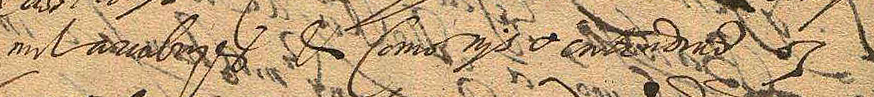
mil arcabuzes & Como njso entendiaõ os
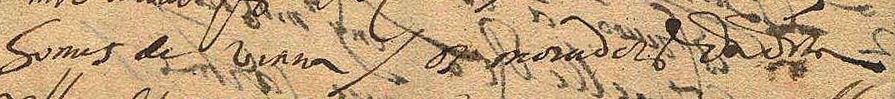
homes de viana / os moradores da dita
